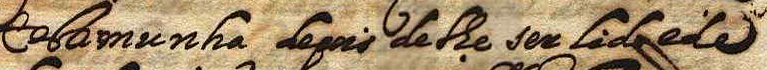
testemunha depois de lhe ser Lido e de
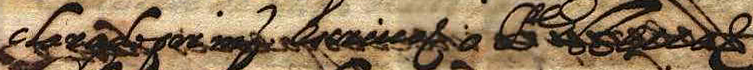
clarado por mj̄ Escriuaõ a P.o Esteuaõ
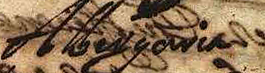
Albergaria
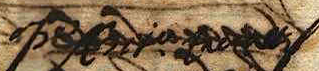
o pe Ant.o tauares
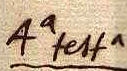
4a testa
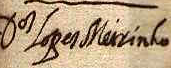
Dos Lopes Meirinho
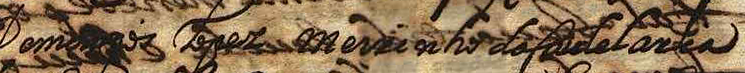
Domingos Lopez meirinho da Codelaria
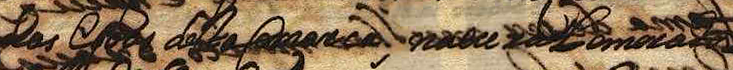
das Cortes desta Comarca; natural e morador
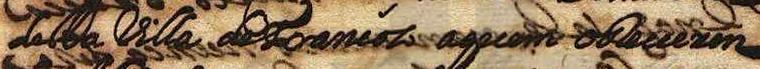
desta Villa de Trancozo a quem o Reueren
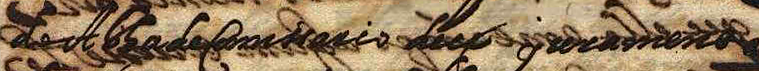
do Abbade Comissario deu juramento
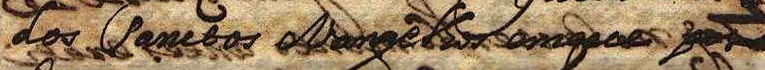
dos Sanctos evangelhos em que pos
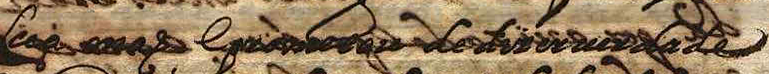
Sua maõ e prometeu de dizer uerdade
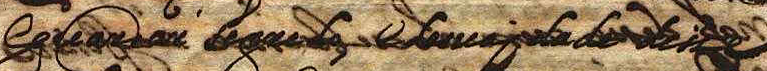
E guardar segredo, e de sua idade disse
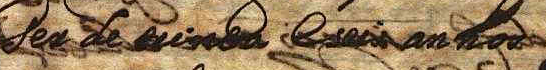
Ser de uinte e seis annos
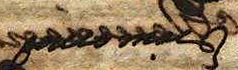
pouco mais
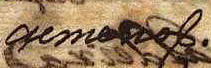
ou menos.
